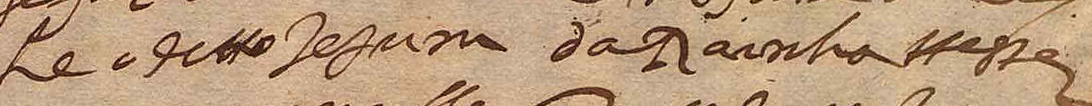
he o ditto Jejum da Rainha Hester
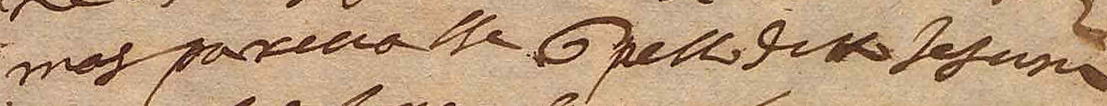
mas parecialhe q̄ pello ditto Jejum
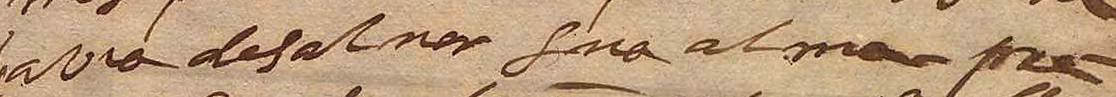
avia de saluar sua alma pre
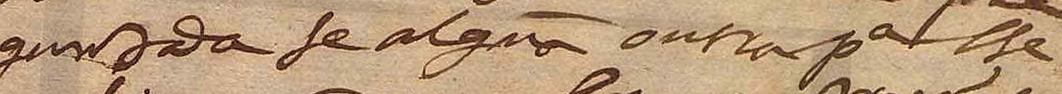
guntada se alguā outra pa lhe
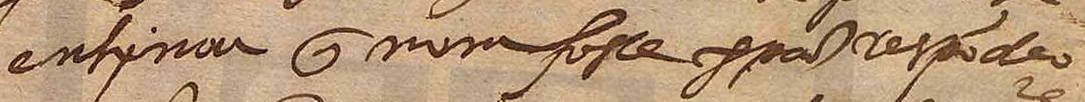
ensynou q̄ nom fosse xpā respōdeo
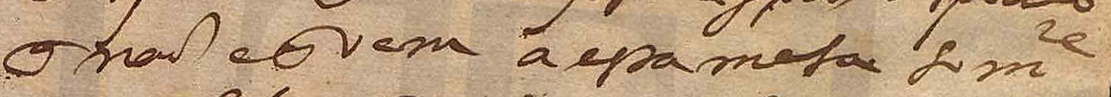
q̄ naõ e q̄ vem a esta mesa somte
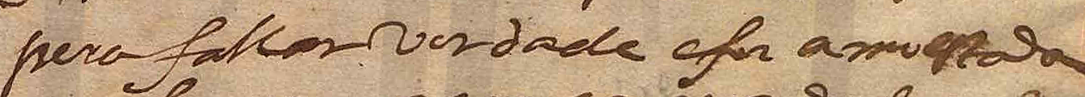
pera fallar verdade e foi amoestada
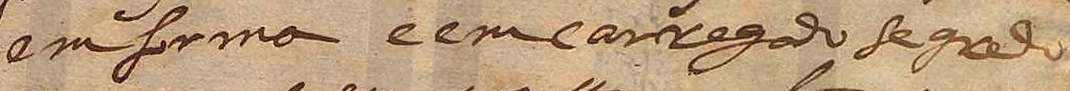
em forma e emcarregado segredo
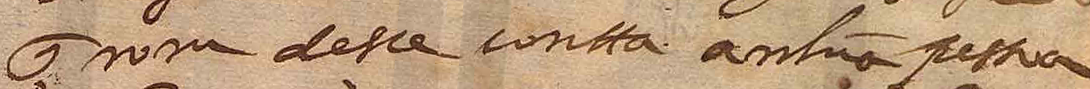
q̄ nom desse contta a nhuā pessoa
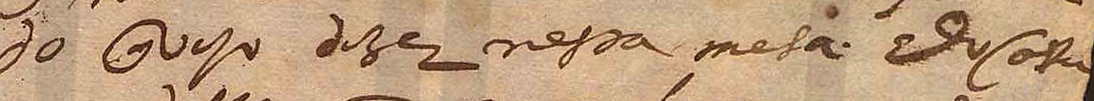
do q̄ vejo dizer nesta mesa. E do Costu
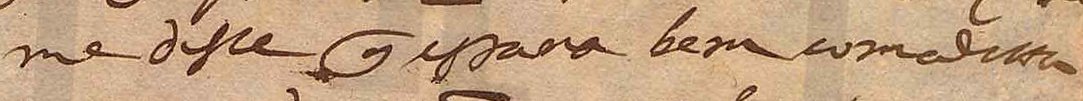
me disse q̄ estaua bem com a ditta
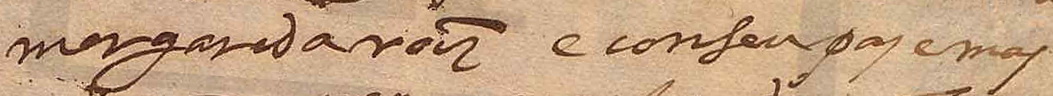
margarida roīz e con seu paj e maj
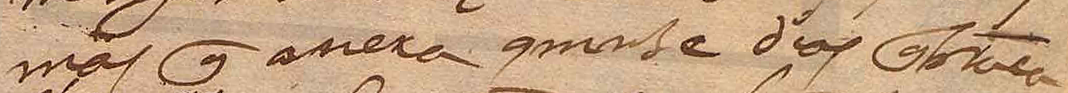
mas q̄ auera quinze dias q̄ brāca
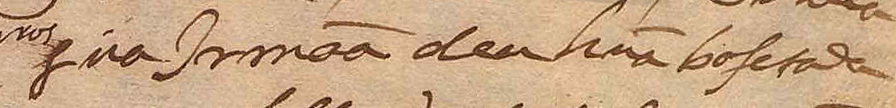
sua Jrmaã deu huā bofetada
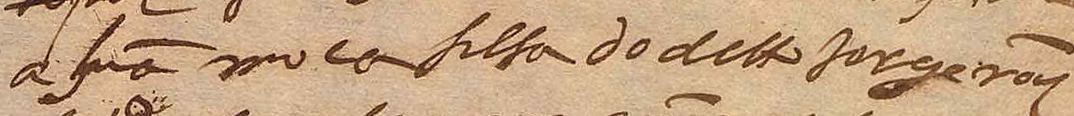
a huā moca filha do ditto Jorge roīz
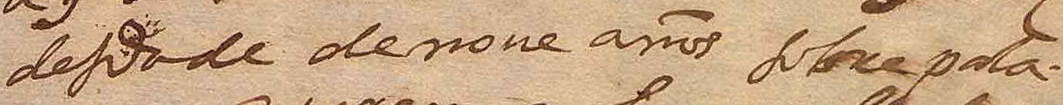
de jdade de noue an̄os sobre pala
